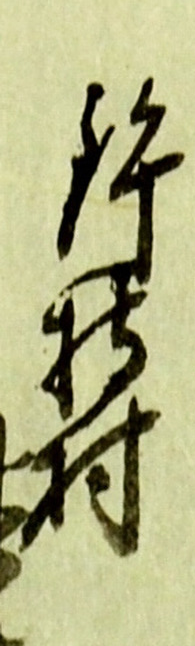鉾持村
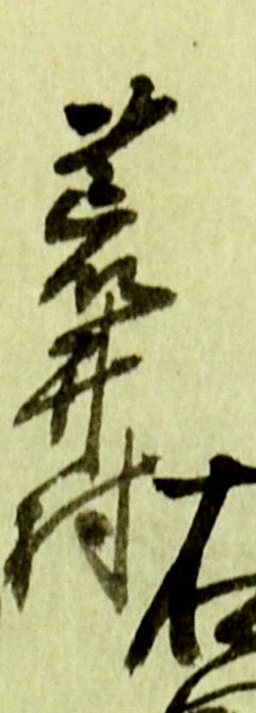荒井村
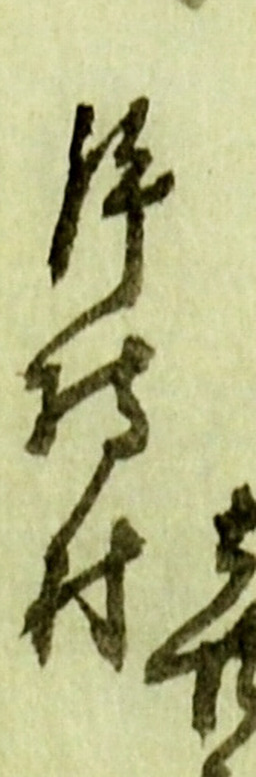鉾持村
